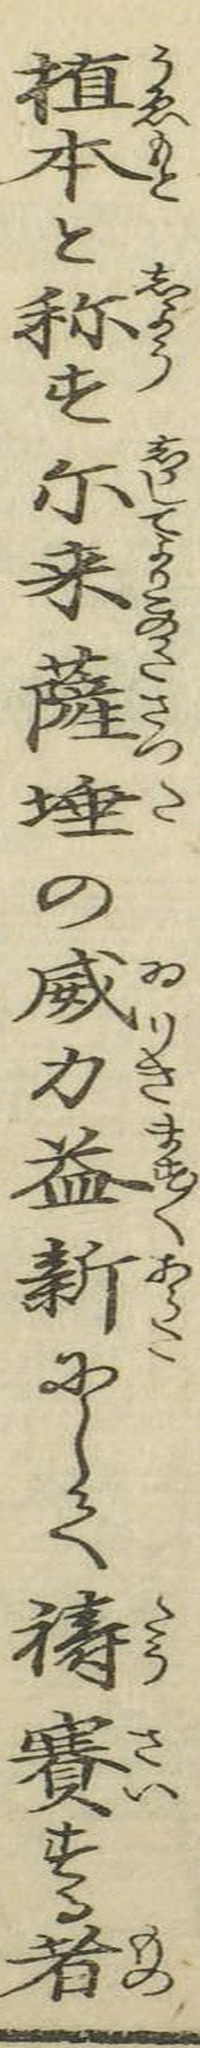植本と称す尓来薩埵の威力益新にして禱賽する者
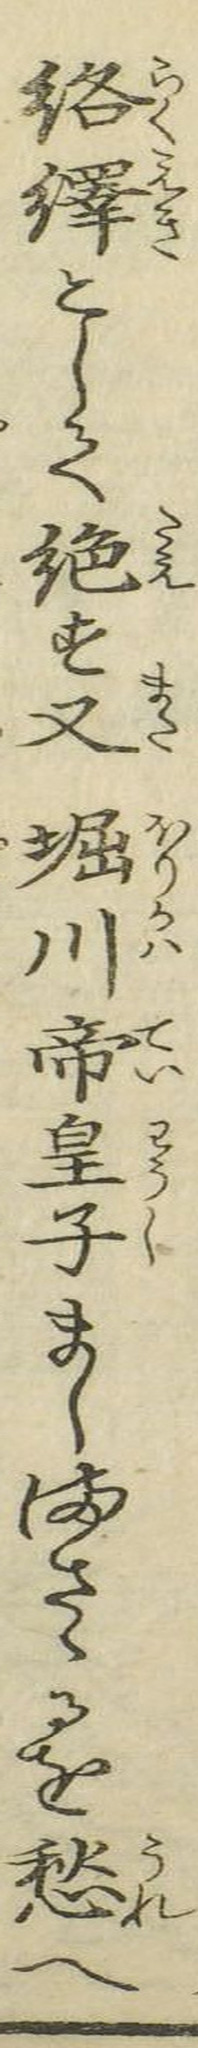絡繹として絶す又堀川帝皇子ましまさゝるを愁へ
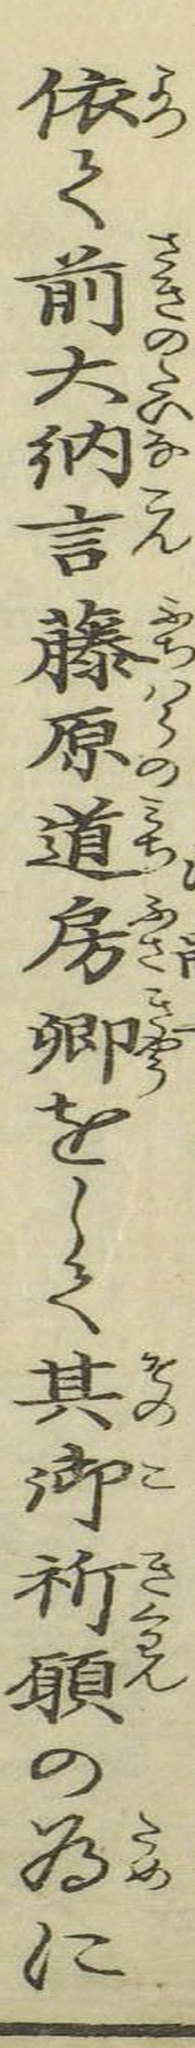依て前大納言藤原道房卿をして其御祈願の為に
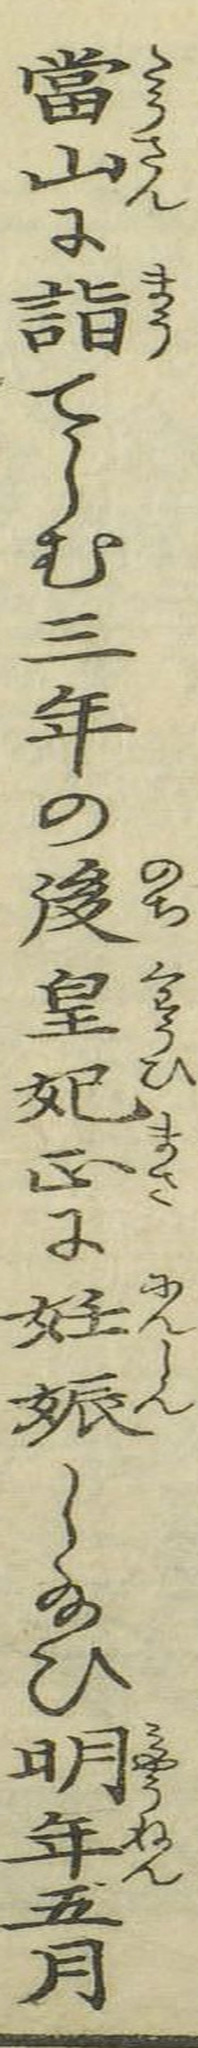當山に詣てしむ三年の後皇妃正に妊娠し給ひ明年五月
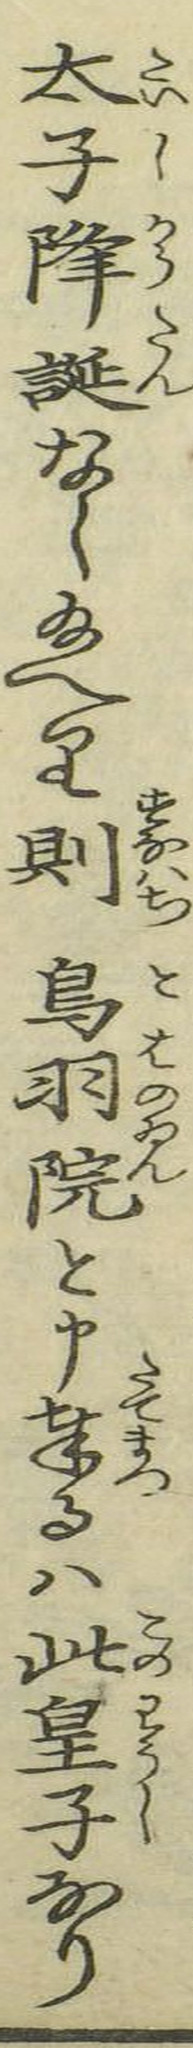太子降誕なし給へり則鳥羽院と申奉るは此皇子なり

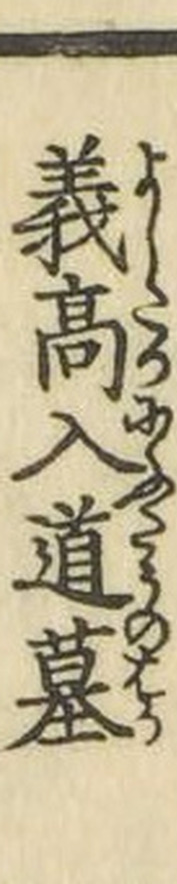義高入道墓
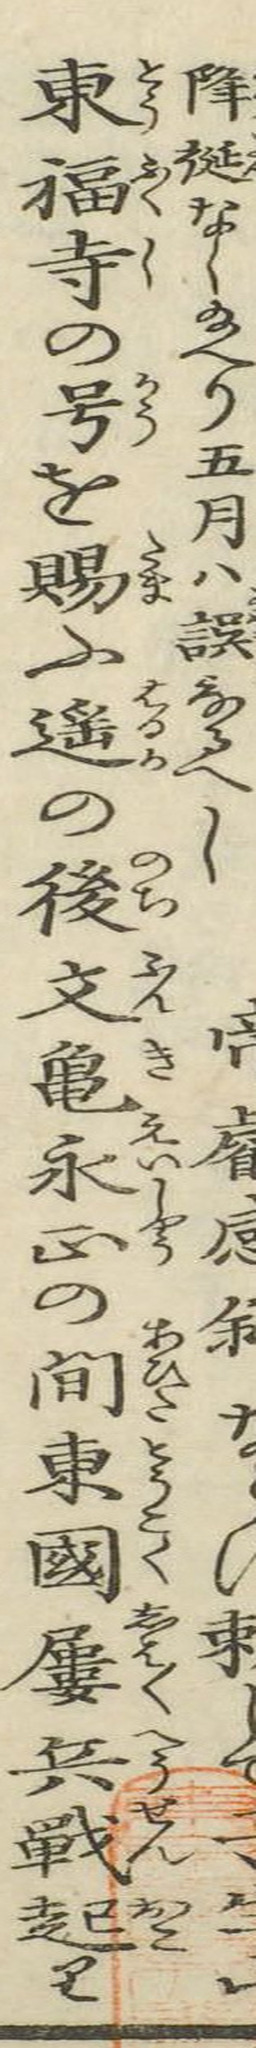東福寺の号を賜ふ遥の後文亀永正の間東國屢兵戦起り
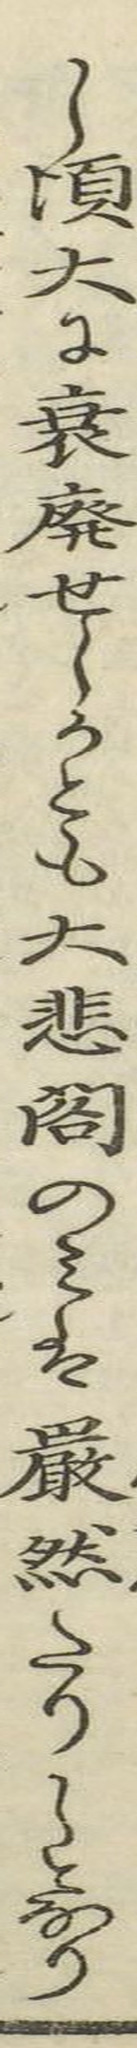し頃大に衰廃せしかとも大悲閣のみは厳然たりしとなり
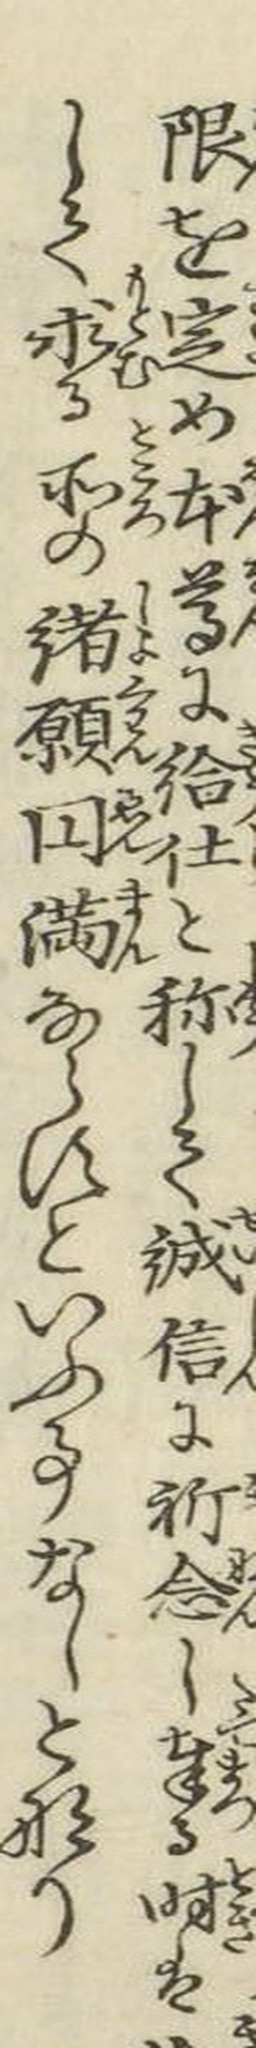して求る所の諸願円満ならすといふ事なしとなり
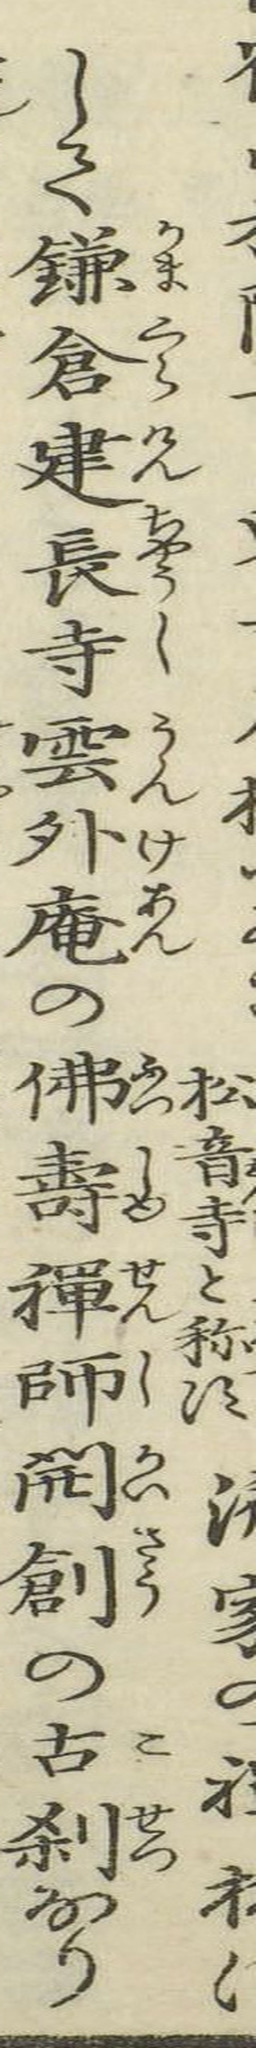して鎌倉建長寺雲外庵の佛壽禅師開創の古刹なり
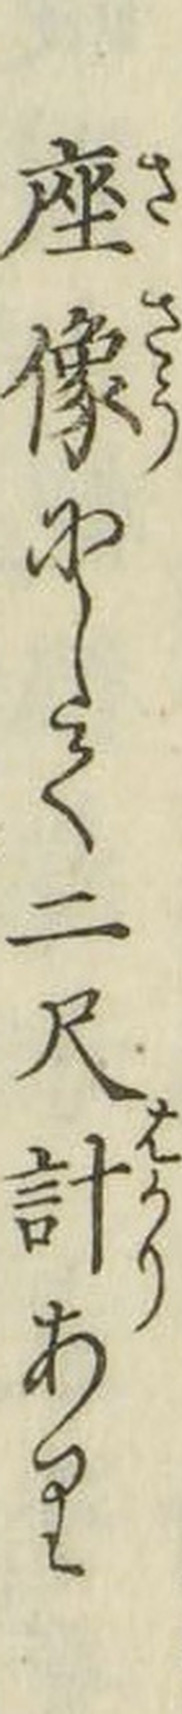座像にして二尺計あり
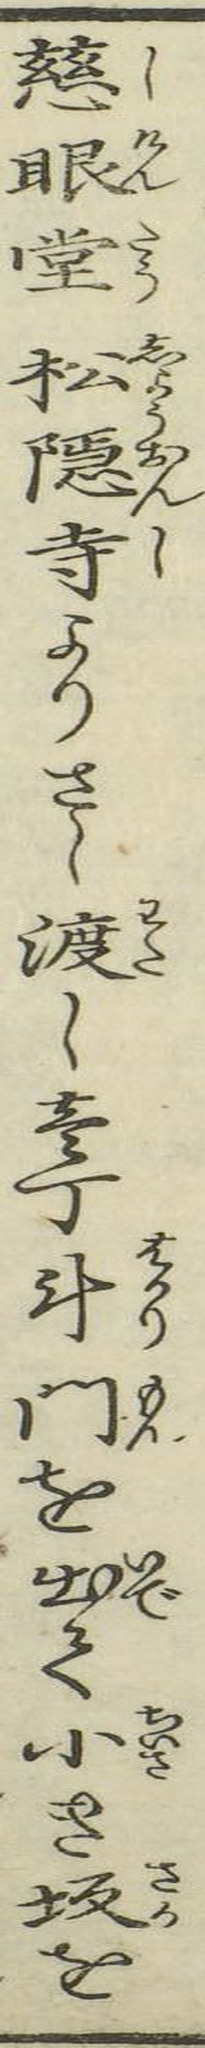慈眼堂松隠寺よりさし渡し壱丁斗門を出て小き坂を
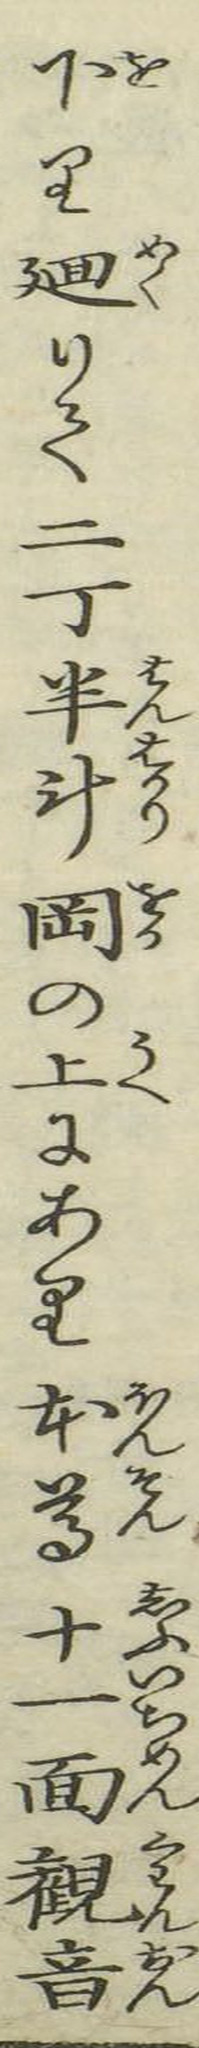下り廻りて二丁半斗岡の上にあり本尊十一面観音
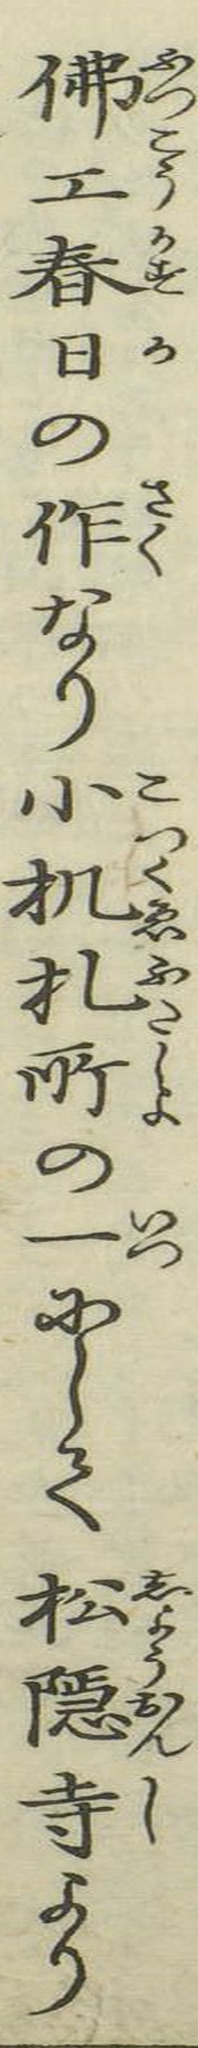佛工春日の作なり小机札所の一にして松隠寺より
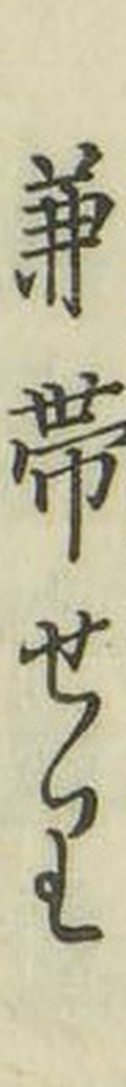兼帯せり

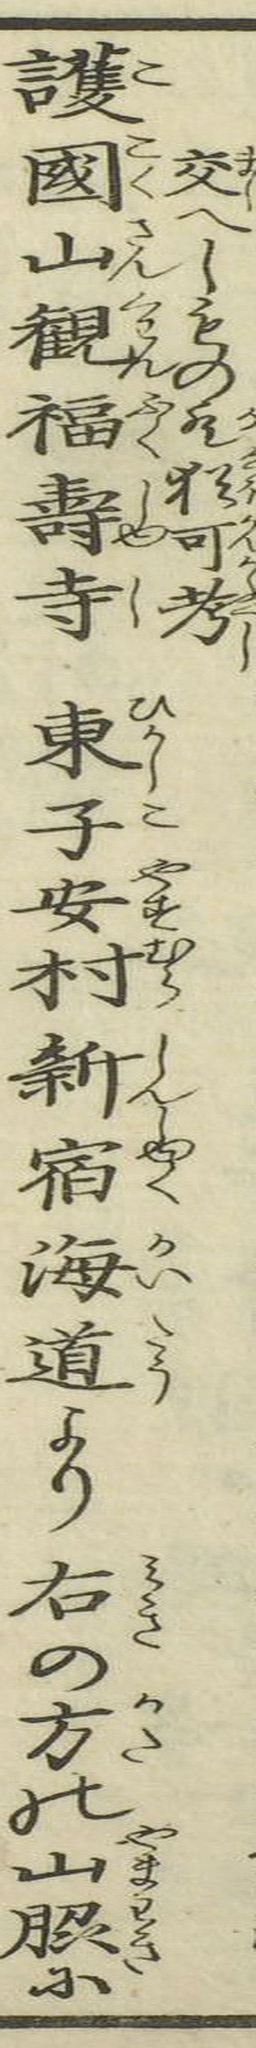護國山観福壽寺東子安村新宿海道より右の方の山脇に
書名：江戸名所図会 20巻 巻之5
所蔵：東京学芸大学教育コンテンツアーカイブ
